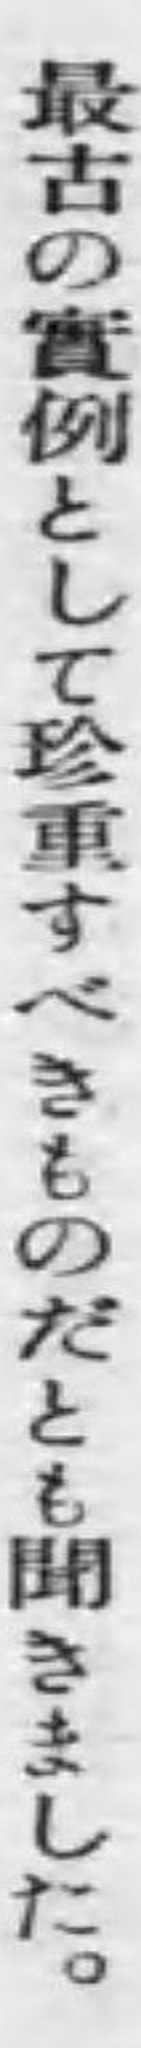最古の実例として珍重すべきものだとも聞きました。
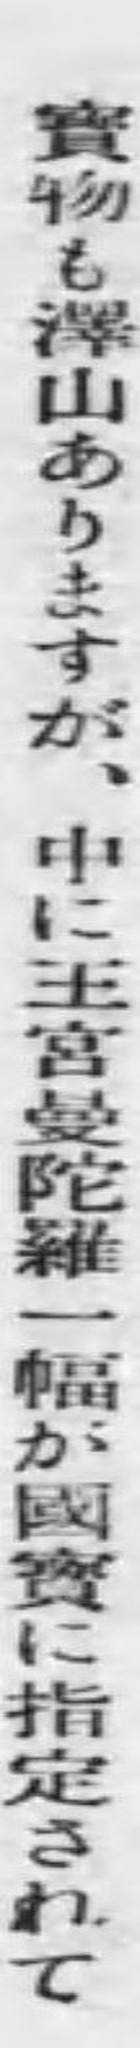宝物も沢山ありますが、中に王宮曼陀羅一幅が国宝に指定されて
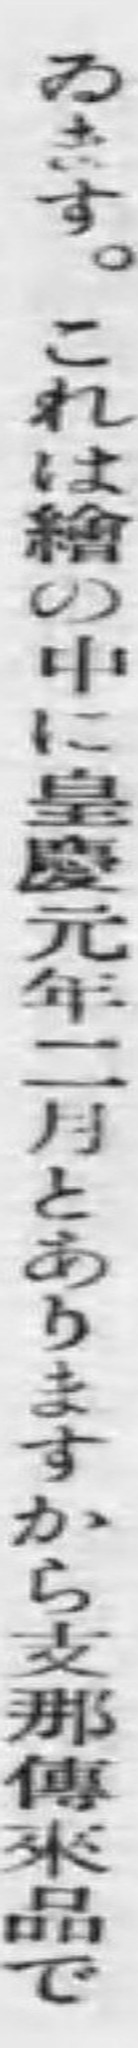ゐます。これは絵の中に皇慶元年二月とありますから支那伝来品で
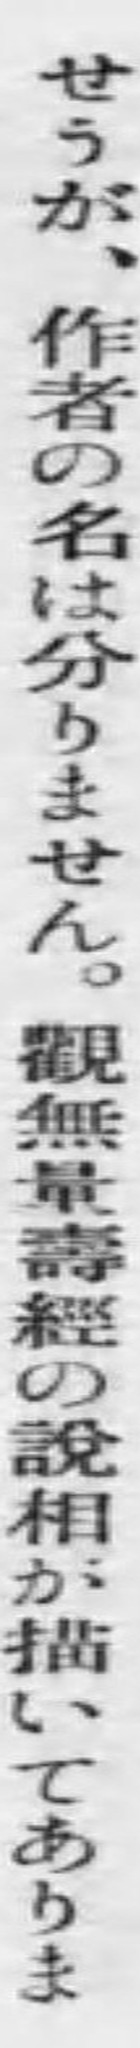せうが、作者の名は分りません。観無量寿経の説相が描いてありま
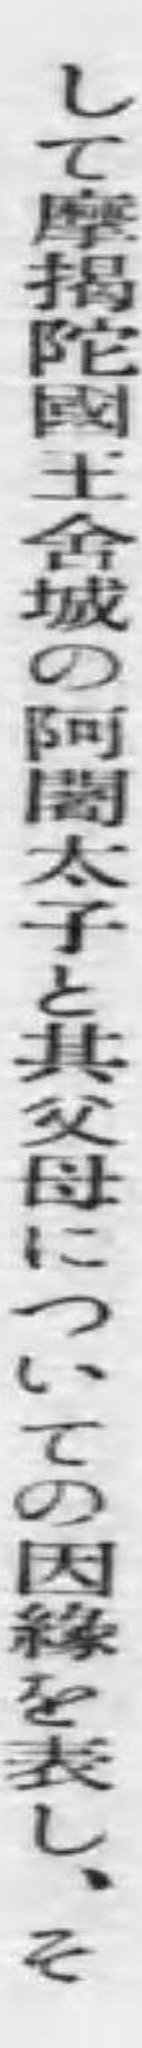して摩掲陀国王舎城の阿闍太子と其父母についての因縁を表し、そ
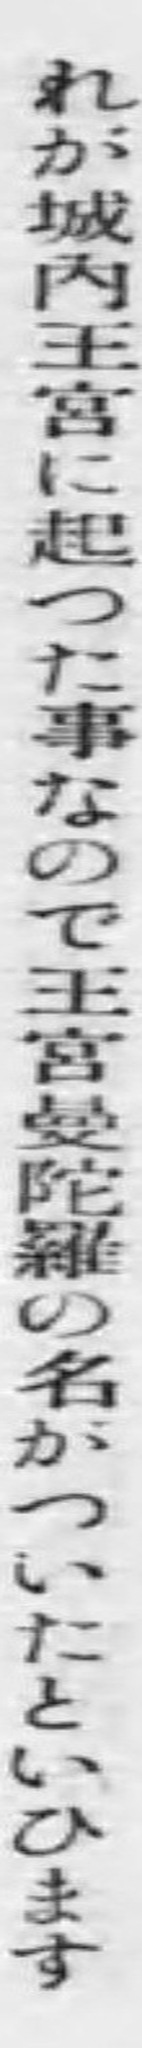れが城内王宮に起つた事なので王宮曼陀羅の名がついたといひます
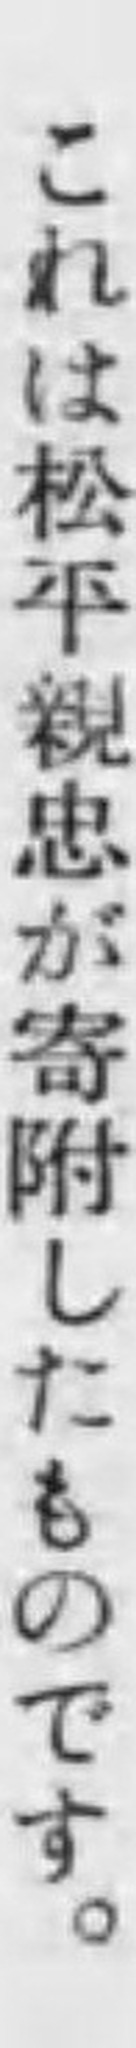これは松平親忠が寄附したものです。
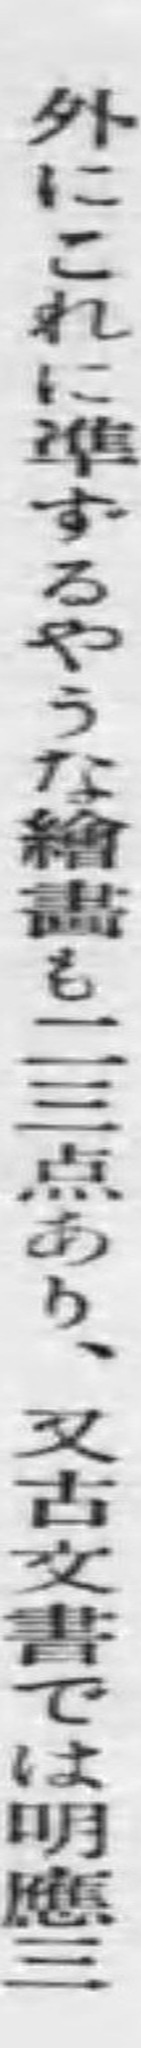外にこれに準ずるやうな絵画も二三点あり、又古文書では明応三
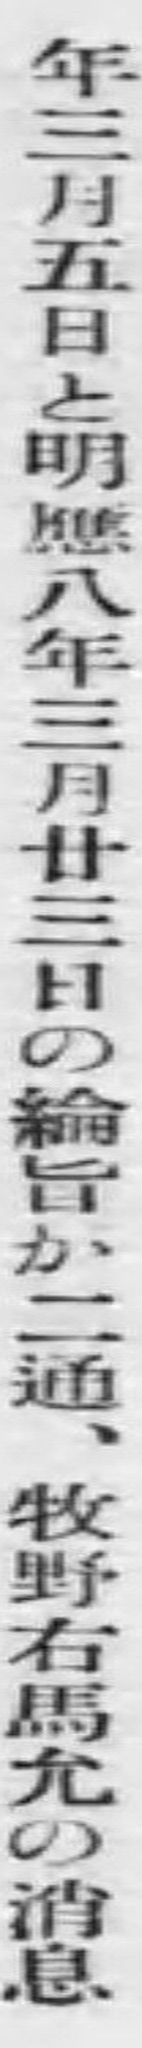年三月五日と明応八年三月廿三日の綸旨が二通、牧野右馬允の消息
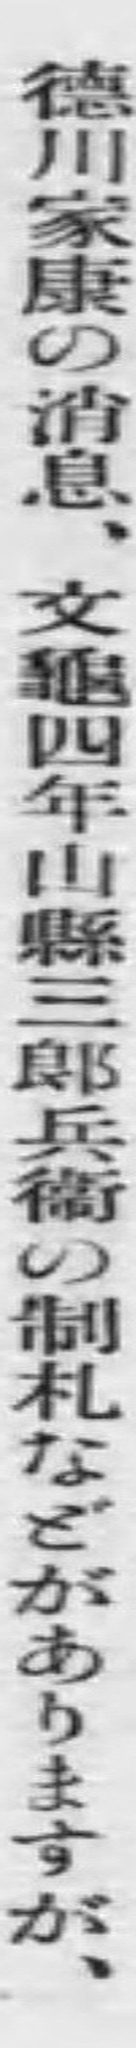徳川家康の消息、文亀四年山県三郎兵衛の制札などがありますが、
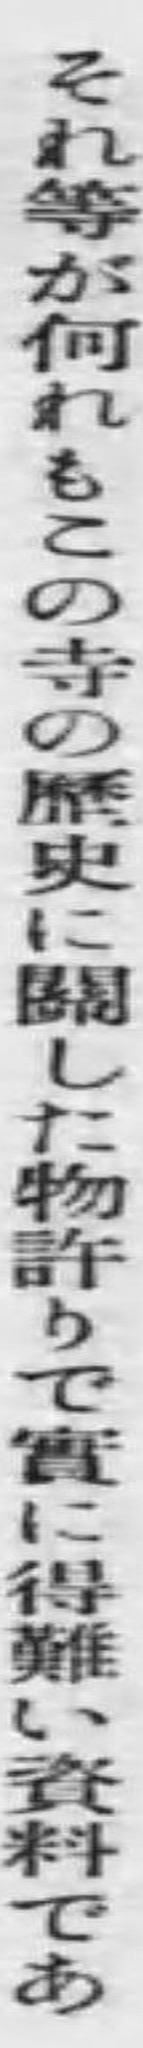それ等が何れもこの寺の歴史に関した物許りで実に得難い資料であ
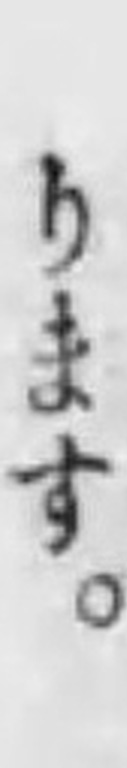ります。
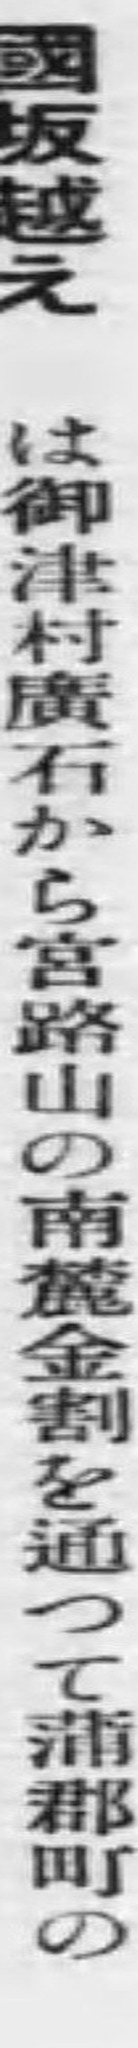国坂越えは御津村広石から宮路山の南麓金割を通つて蒲郡町の
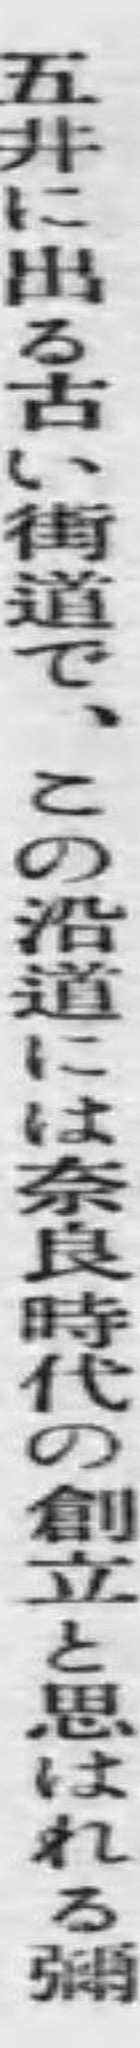五井に出る古い街道で、この沿道には奈良時代の創立と思はれる弥
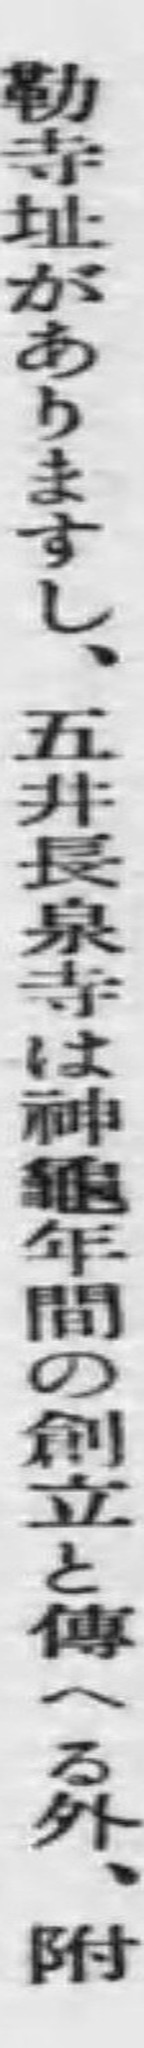勒寺址がありますし、五井長泉寺は神亀年間の創立と伝へる外、附
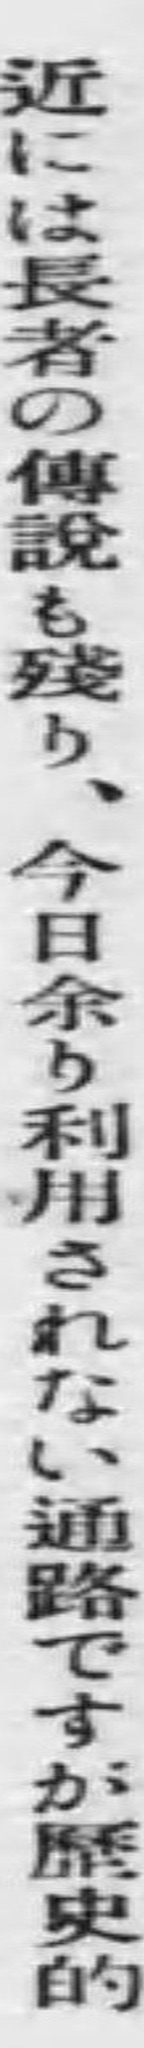近には長者の伝説も残り、今日余り利用されない通路ですが歴史的
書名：東三河道中記 : 豊橋市及其附近案内
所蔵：国立国会図書館 National Diet Library, JAPAN
